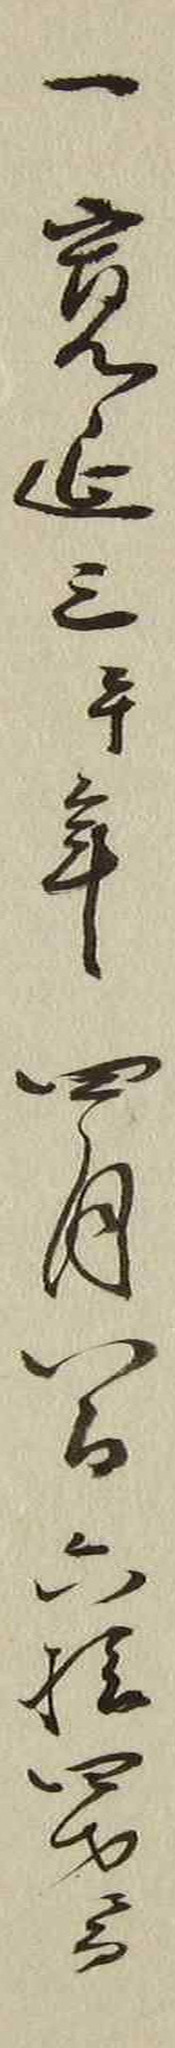一寛延三午年四月八日六拾四才ニ而
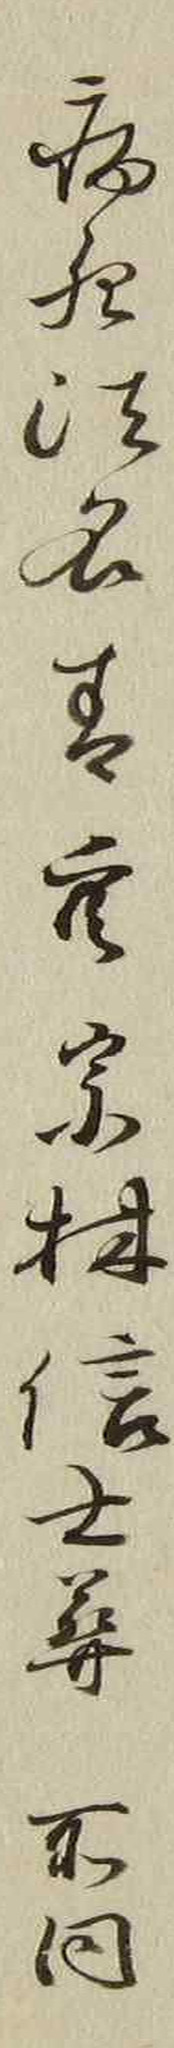病死法名青空宗林信士葬所同

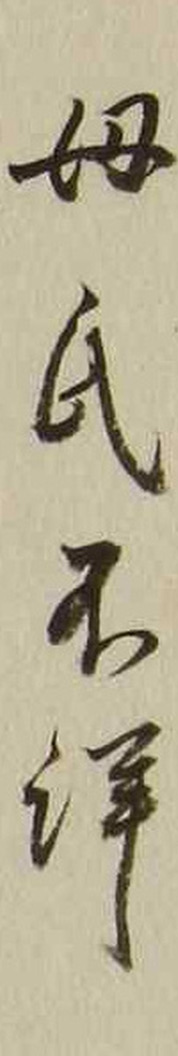母氏不詳
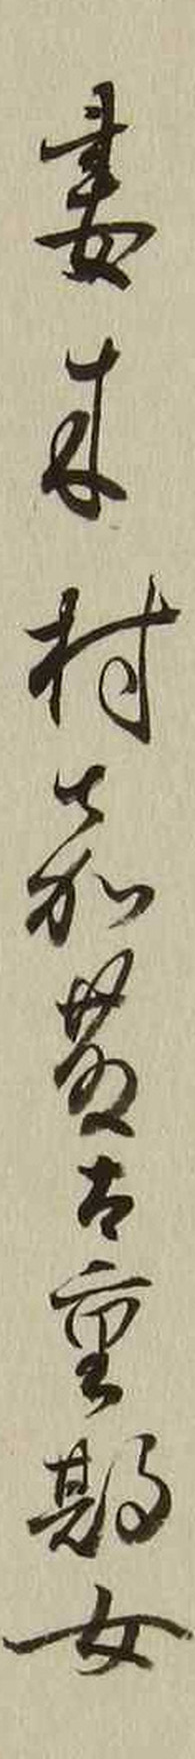妻木村嘉藤太重期女
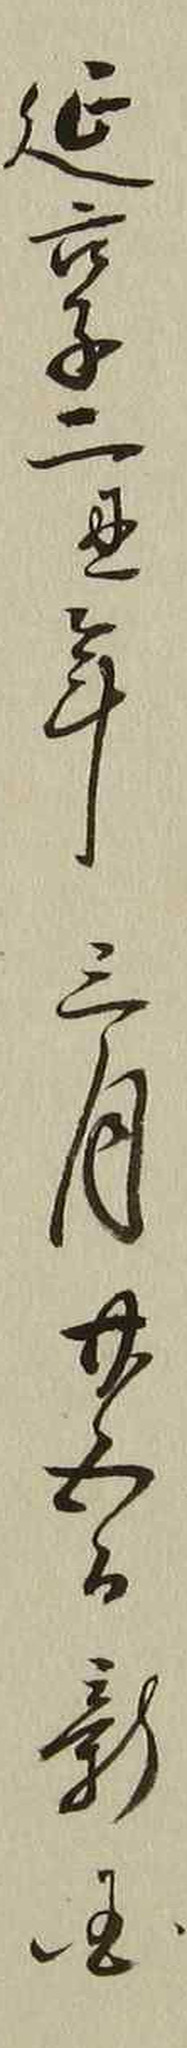延享二丑年三月廿五日新国
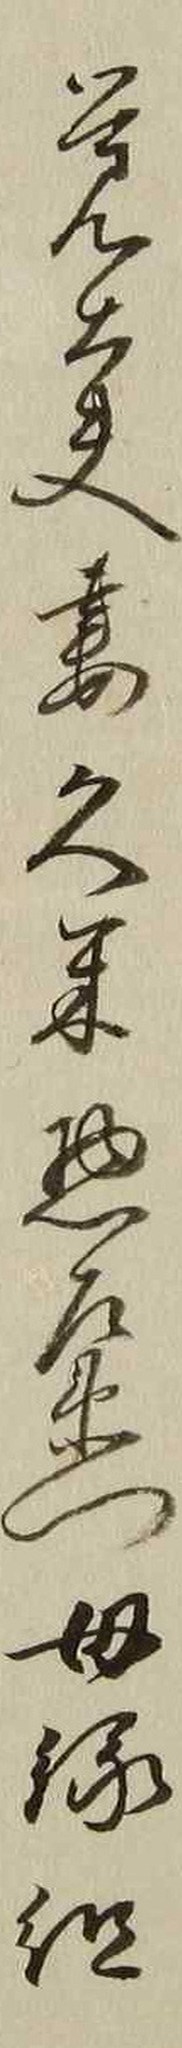覚大夫妻久米惣左衛門母縁組
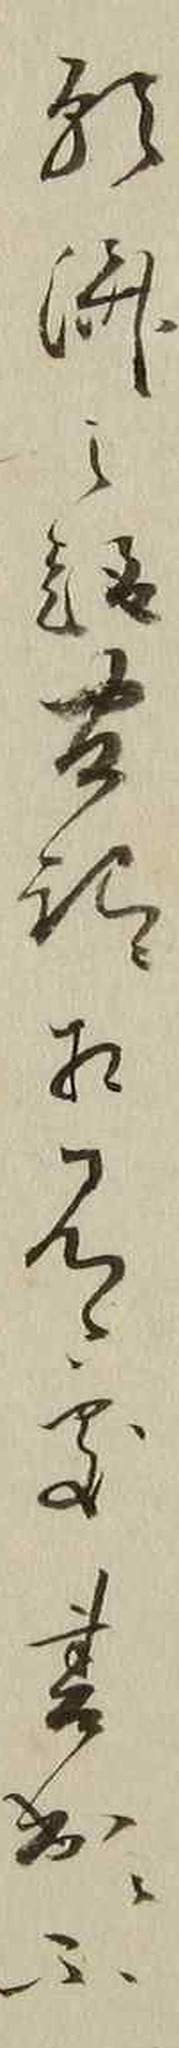願済之趣官記ニ相見候処書出ニ不
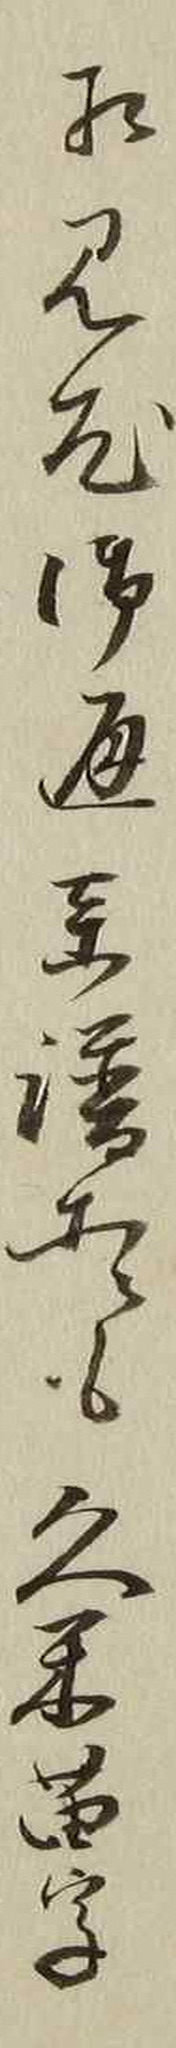相見尤御通系譜等ニも久米苗字
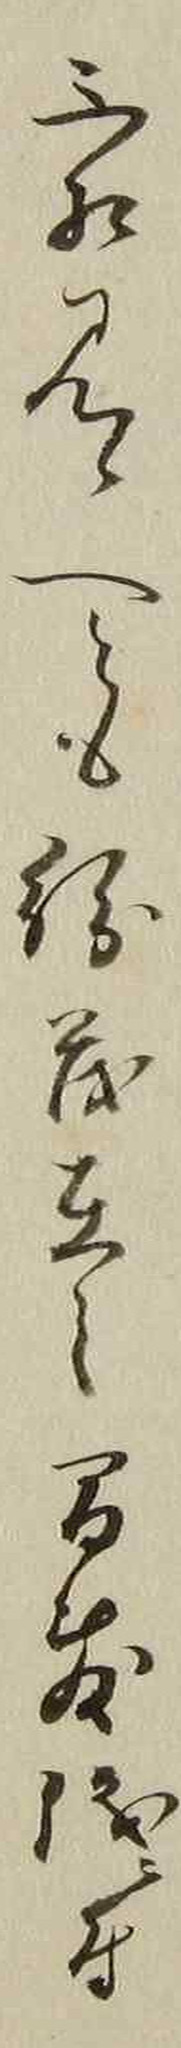不相見候へとも紛茂在之間敷儀ニ付
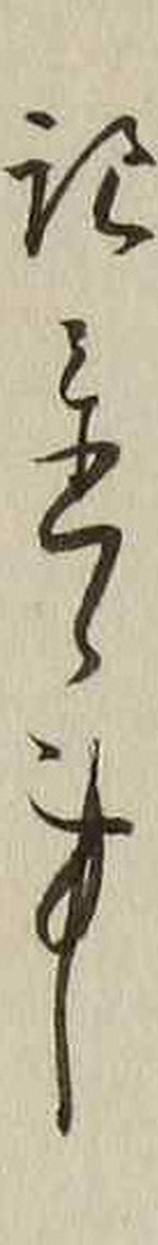記置候事
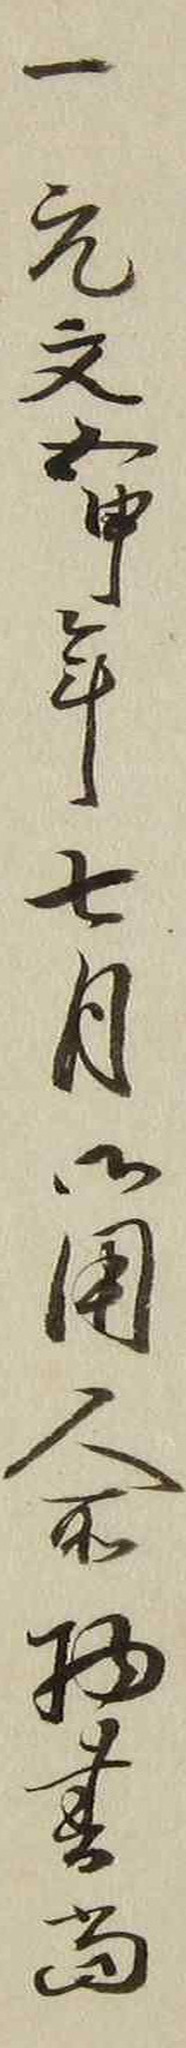一元文五申年七月御用人所物書当
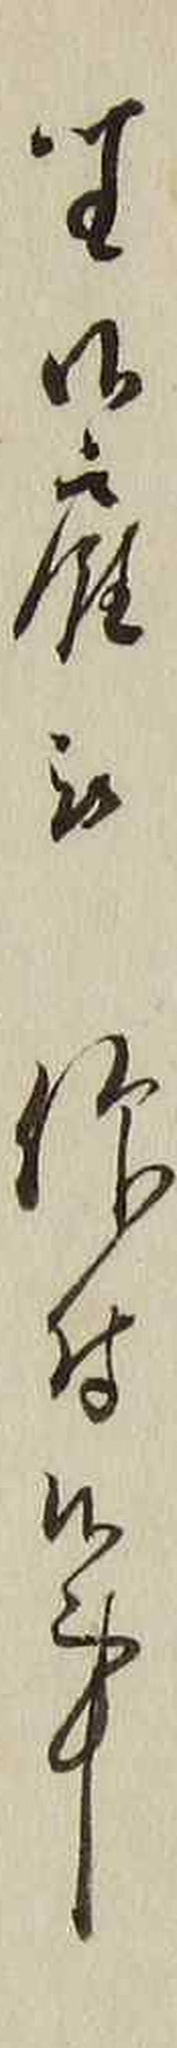坐御雇被仰付候事
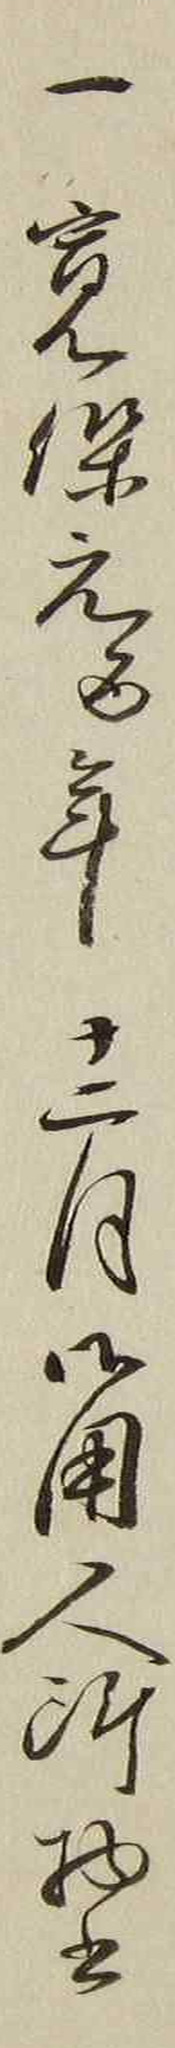一寛保元酉年十二月御用人所物書
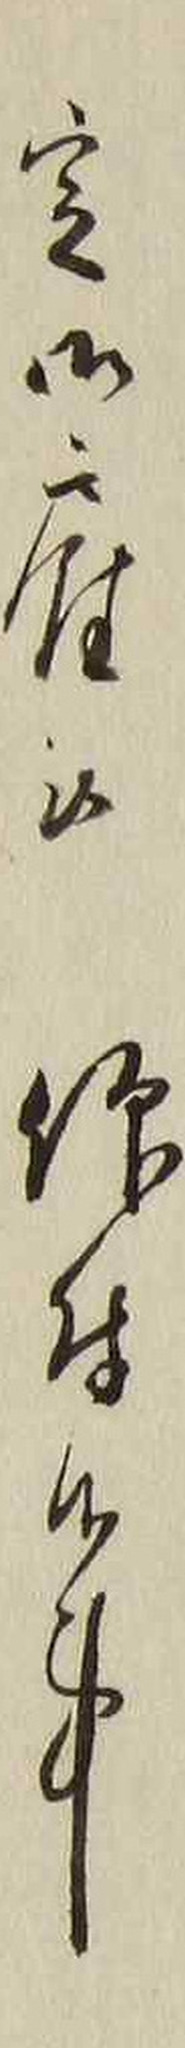定御雇被仰付候事
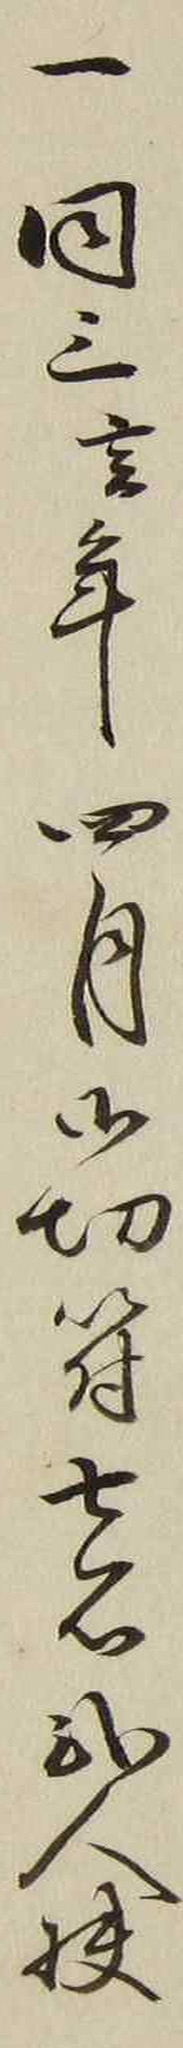一同三亥年四月御切符七石弐人扶

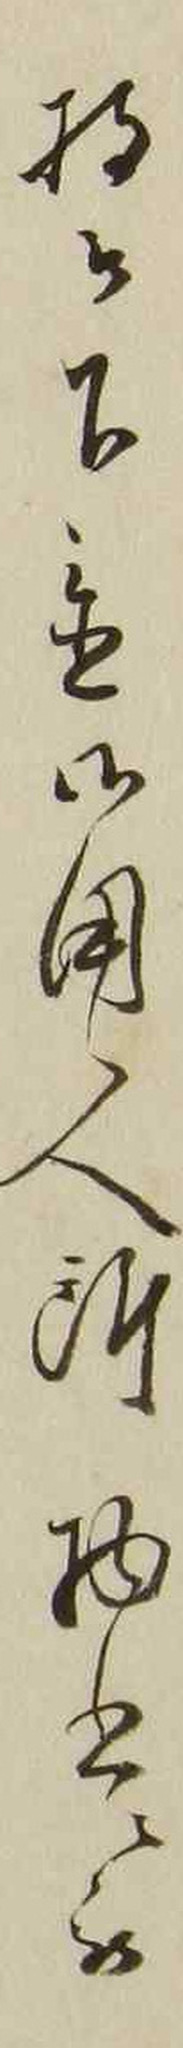持被下置御用人所物書ニ而
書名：諸士系譜　巻之52　に之部3
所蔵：会津若松市立会津図書館
